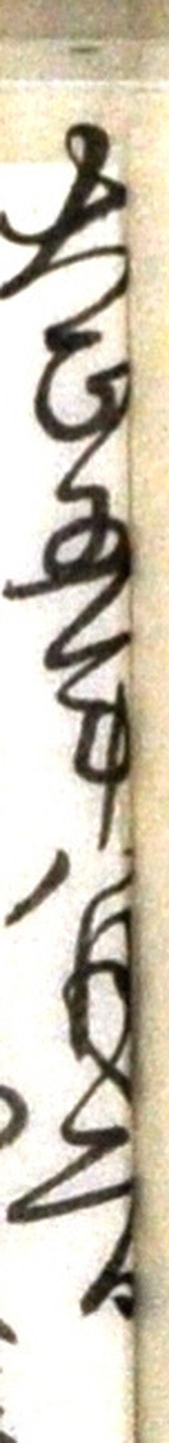大正五年八月二日
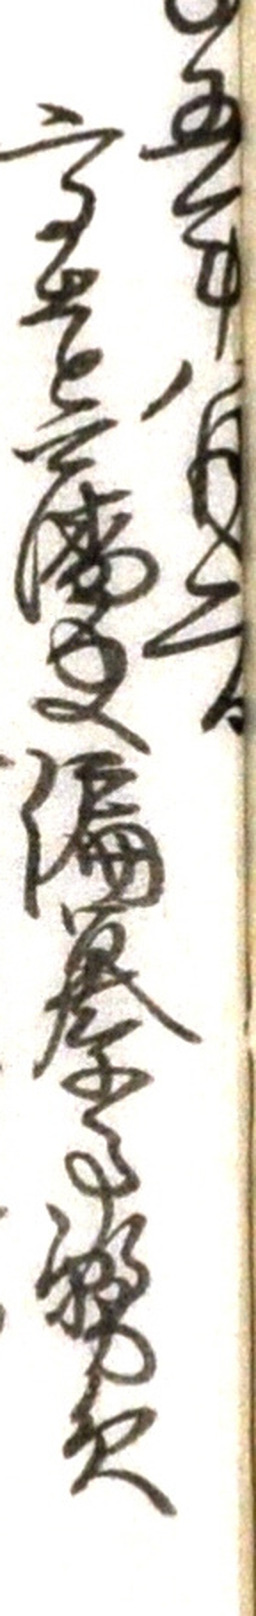高遠藩史編纂事務負
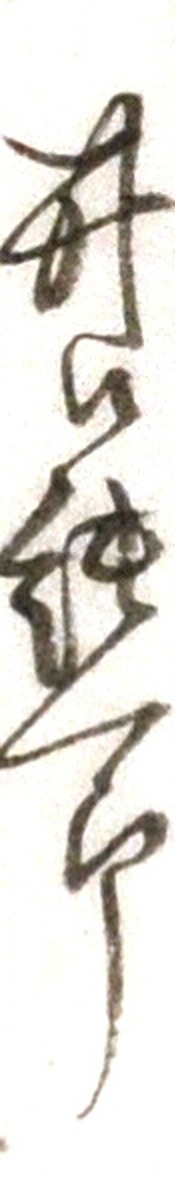井口純一郎
